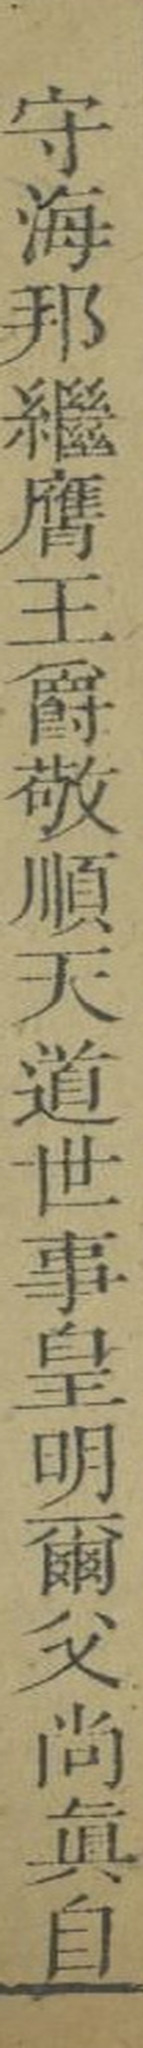守海邦継膺王爵敬順天道世事皇明爾父尚真自
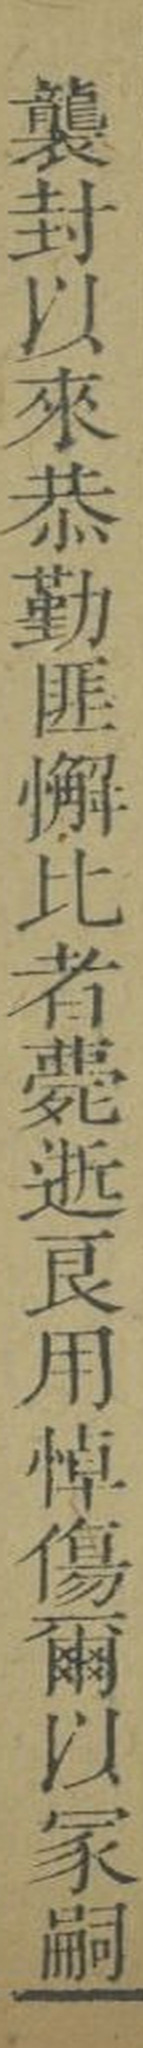襲封以来恭勤匪懈比者薨逝良用悼傷爾以冢嗣
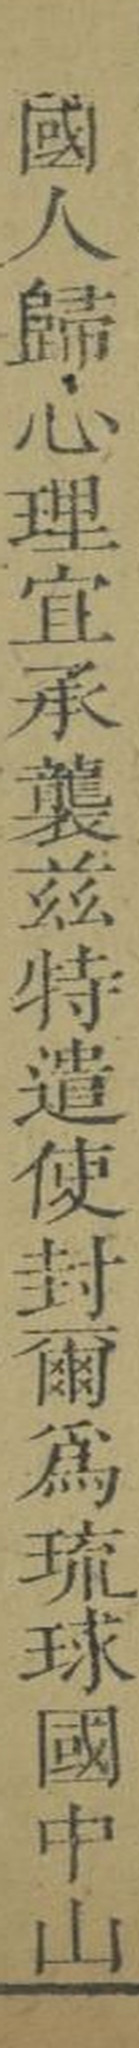国人帰心理宜承襲茲特遣使封爾為琉球国中山
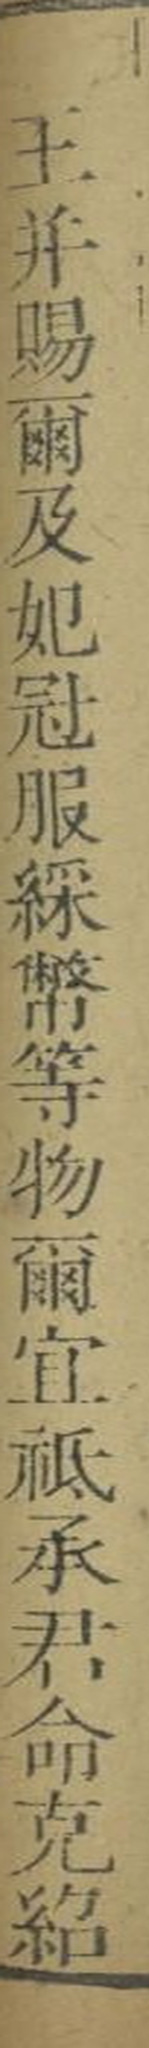王并賜爾及妃冠服綵幣等物爾宜祇承君命克紹
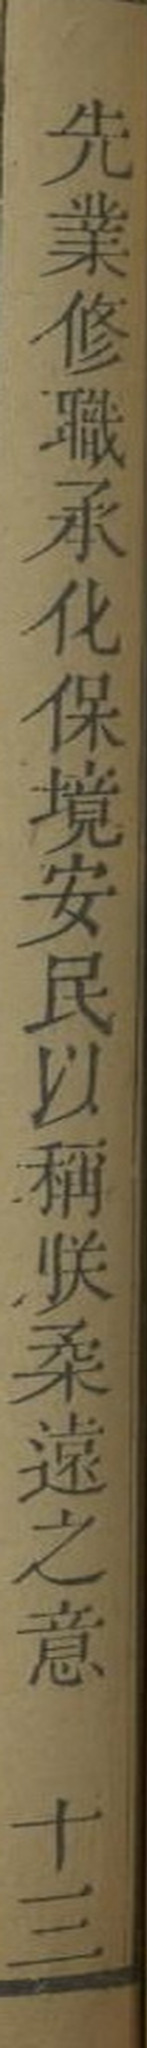先業修職承化保境安民以称朕柔遠之意十三
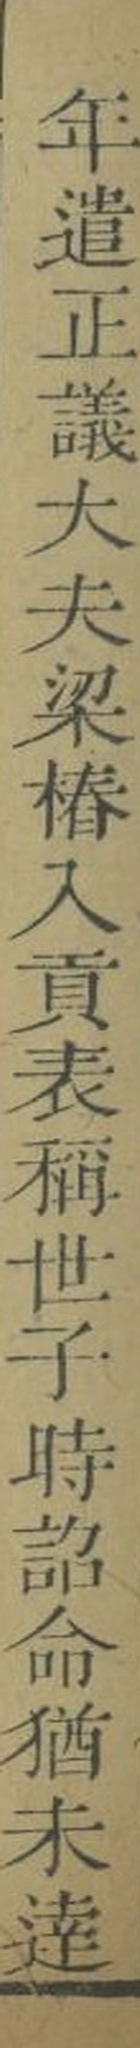年遣正議大夫梁椿入貢表称世子時詔命猶未達
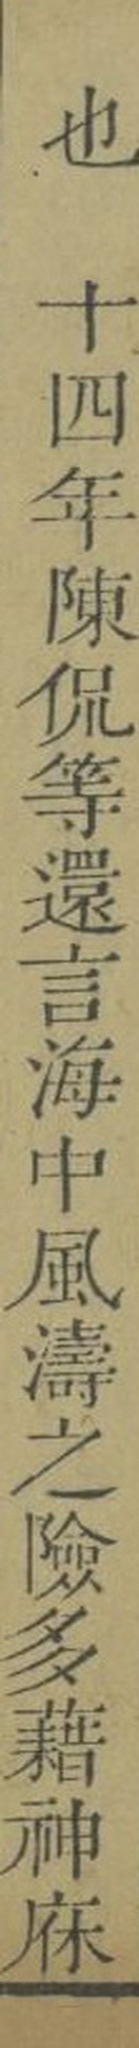也十四年陳侃等還言海中風濤之険多藉神庥
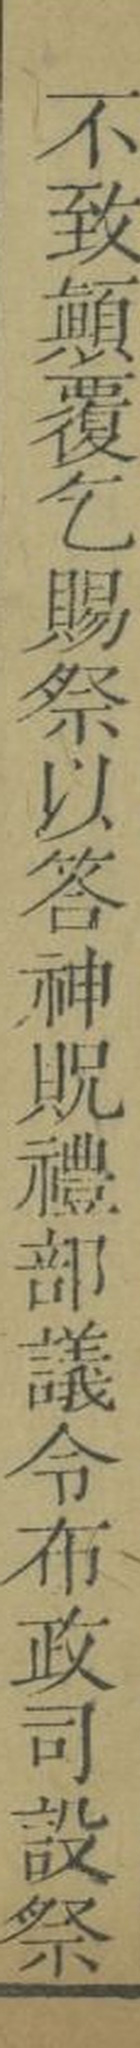不致顚覆乞賜祭以答神貺礼部議令布政司設祭
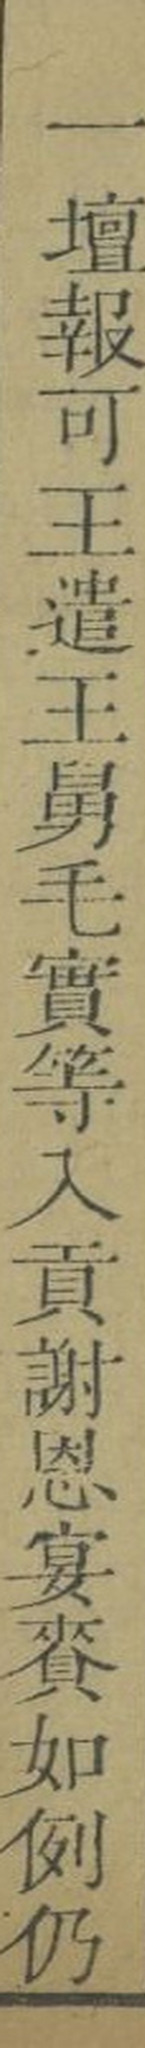一壇報可王遣王舅毛実等入貢謝恩宴賚如例仍
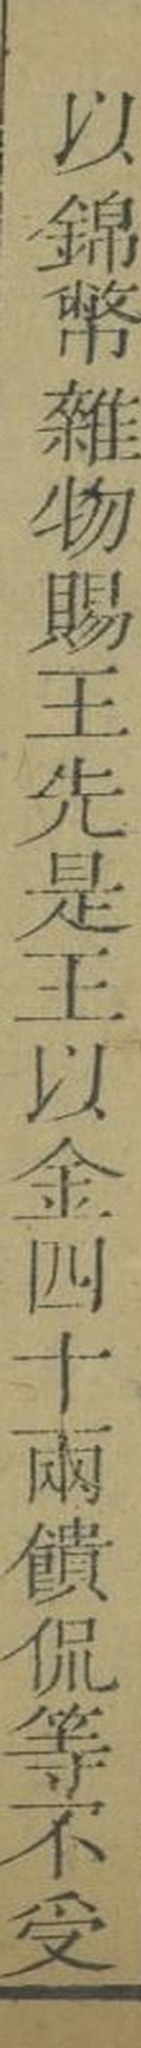以錦幣雑物賜王先是王以金四十両饋侃等不受
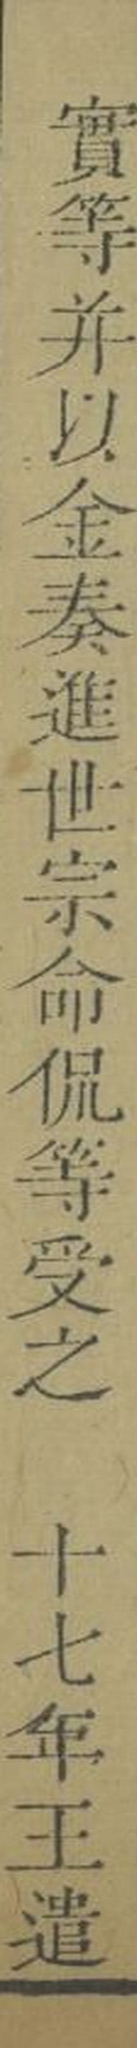実等并以金奏進世宗命侃等受之十七年王遣
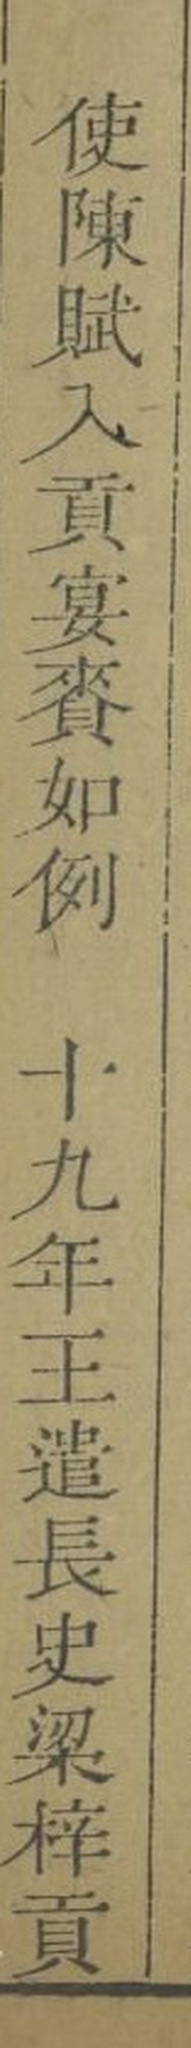使陳賦入貢宴賚如例十九年王遣長史梁梓貢
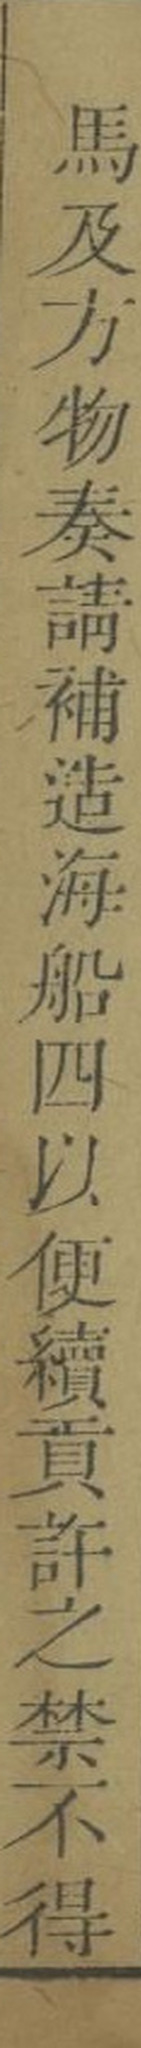馬及方物奏請補造海船四以便続貢許之禁不得

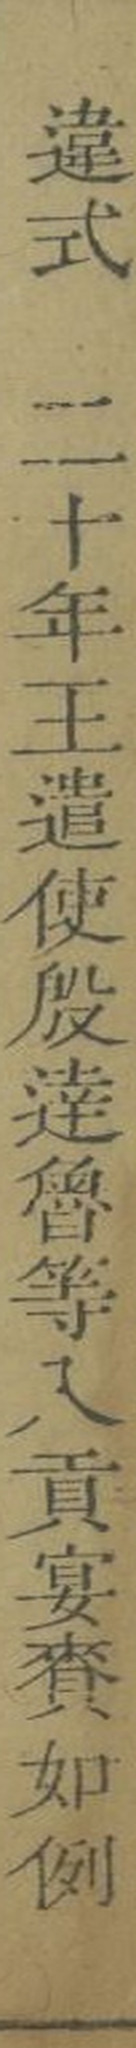違式二十年王遣使殷達魯等入貢宴賚如例
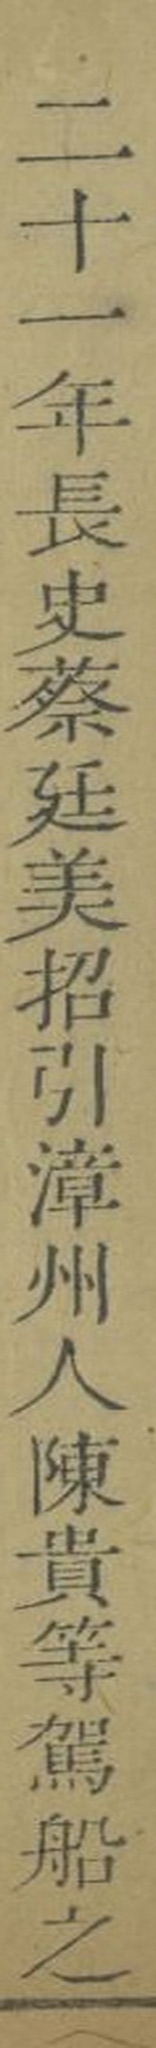二十一年長史蔡廷美招引漳州人陳貴等駕船之
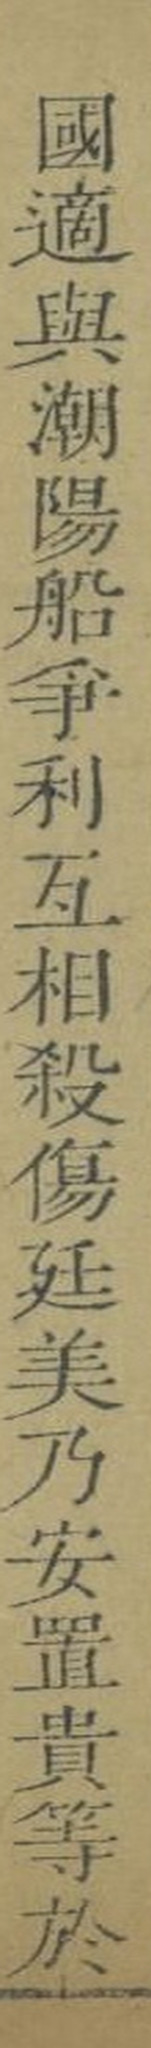国適与潮陽船争利互相殺傷廷美乃安置貴等於
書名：中山伝信録 巻三
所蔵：University of the Ryukyus Library
